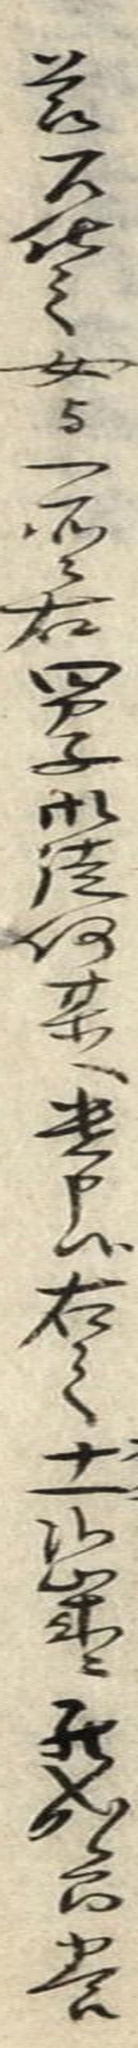節召仕之女与一所ニ右男子御徒何某ヘ遣申候右之十一弐歳罷成候間養子ニ致度旨
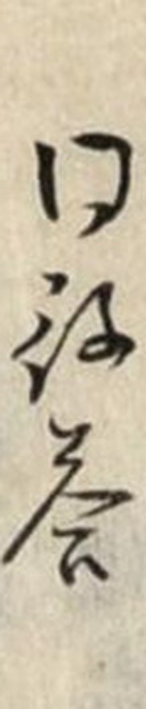同役答
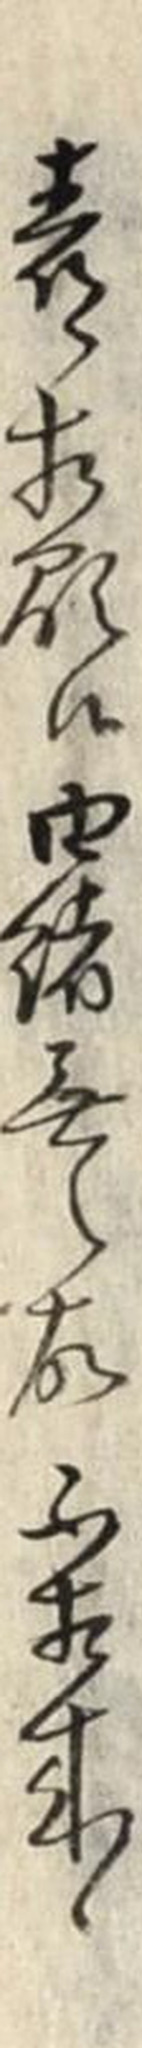表之相願口由緒無之故不相成候
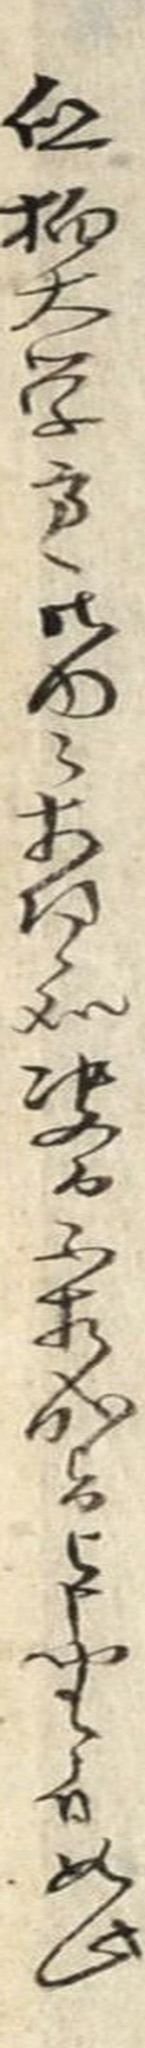但狛大学方ヘ御内々相伺候処決而不相成旨被申聞候ニ付如此
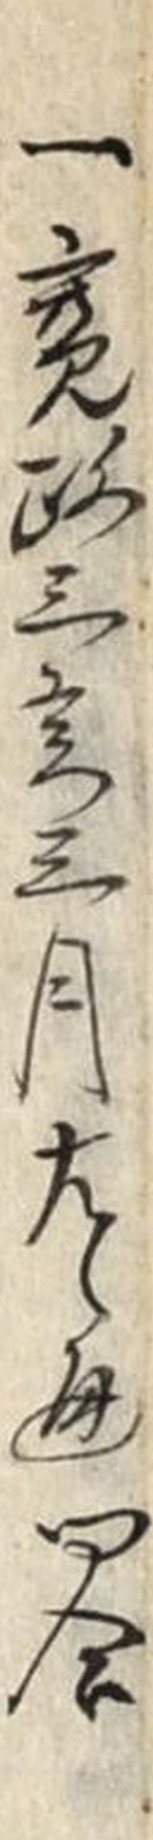一寛政三寅三月左之通り問合
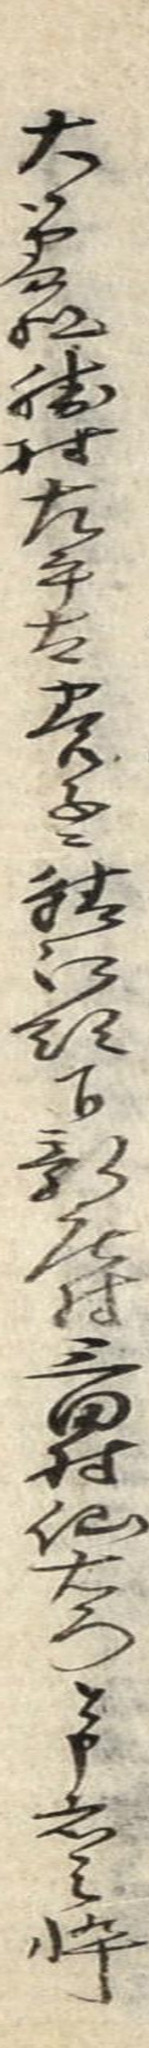大御番組勝村左平太養子ニ鯖江組下新庄村三田村仙右エ門と申者之倅
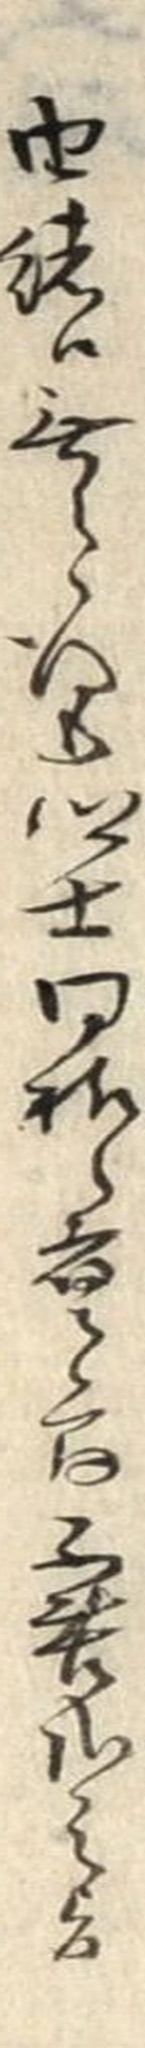由緒ハ無之候得共郷士同様之者ニ候間不苦哉之旨

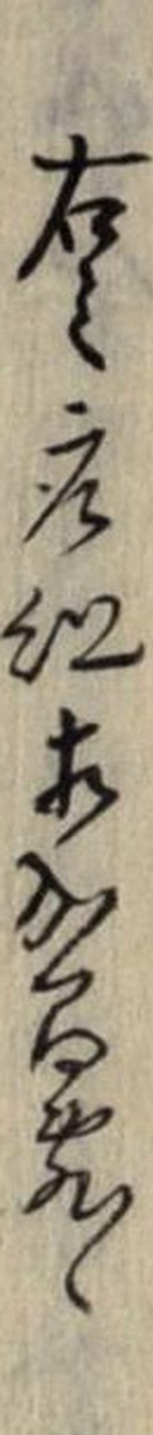右之取組相成間敷候
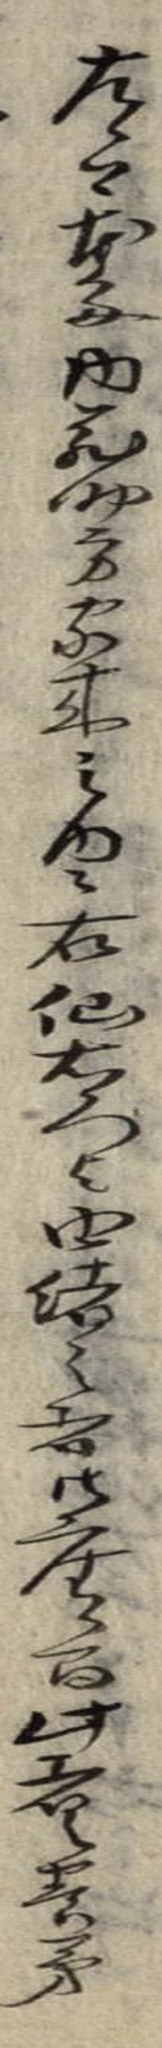左候ハヽ本多内蔵助方家来之内ニ右仙右衛門与由緒之者御座候間此者之養弟
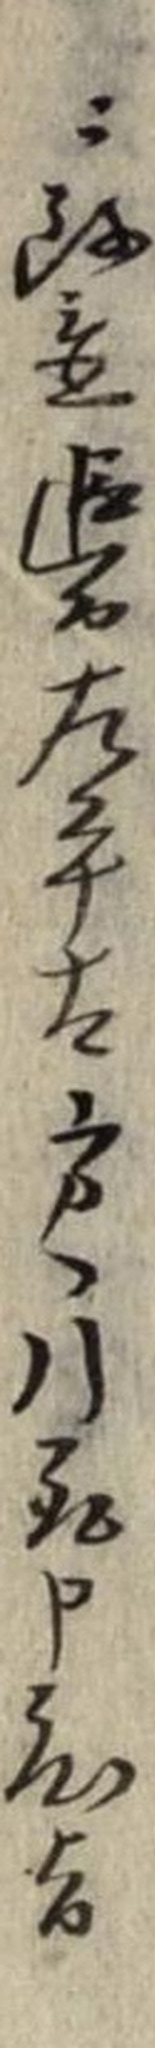ニ致置追而佐平太方ヘ引取申度旨
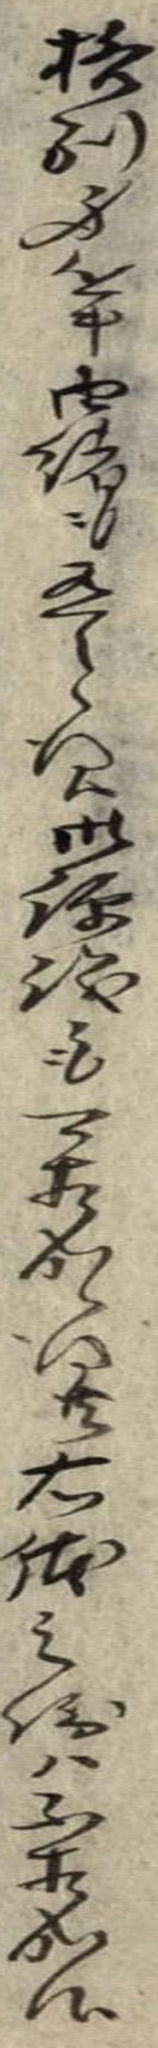格別身近キ由緒も有之候得ハ御評議ニも可相成候得共右体之儀ハ不相成候
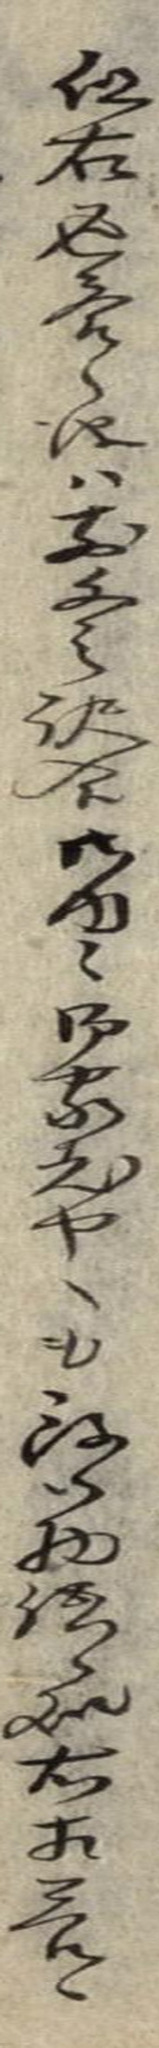但右返答之儀ハ別文之訳合御内々御家老中ヘも致御物語候処右相答候
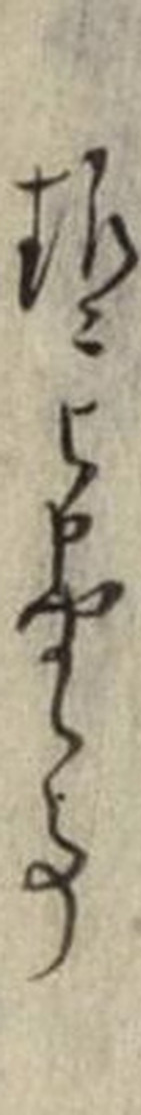趣ニ被申聞候事
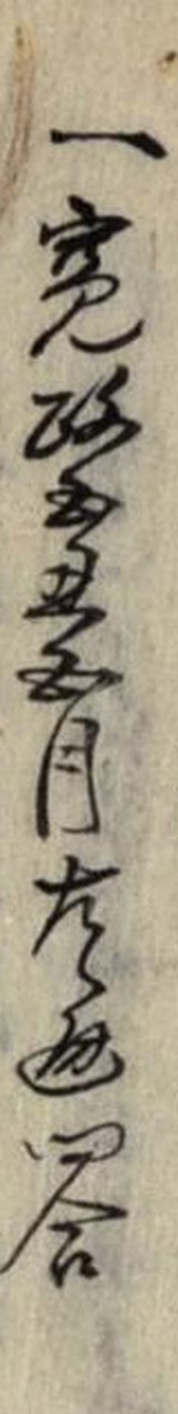一寛政五丑五月左之通問合
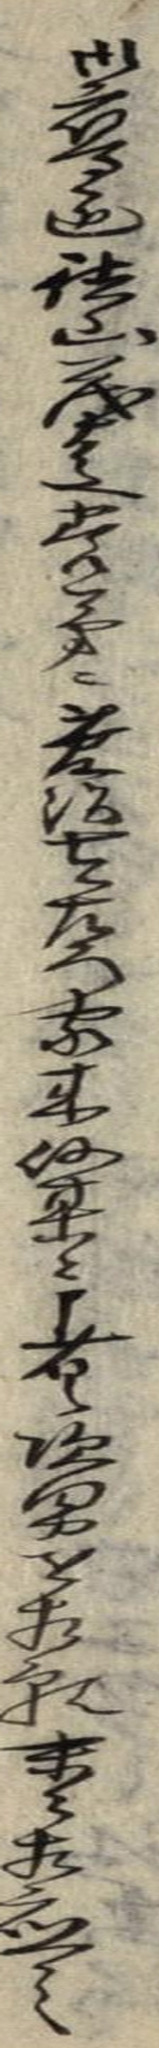御鷹匠徳山茂太夫養弟ニ菅沼七左衛門家来何某と申者之次男を相願末々相応之
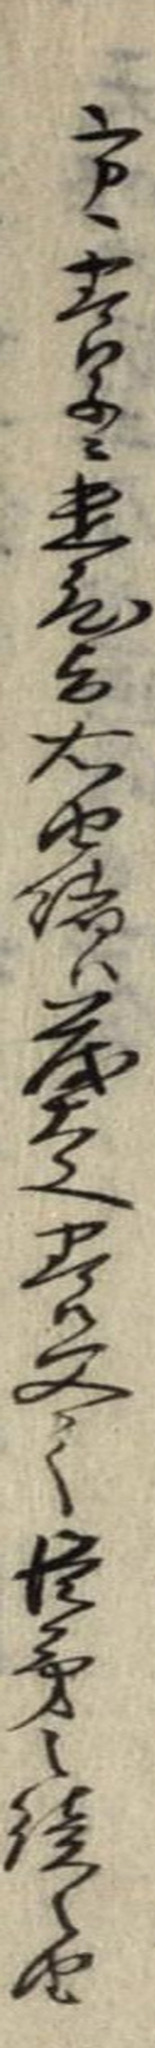方へ養子ニ遣度旨右由緒ハ茂太夫養父之従弟之続候由
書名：養子縁組之部
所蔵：福井県文書館 Fukui Prefectural Archives
